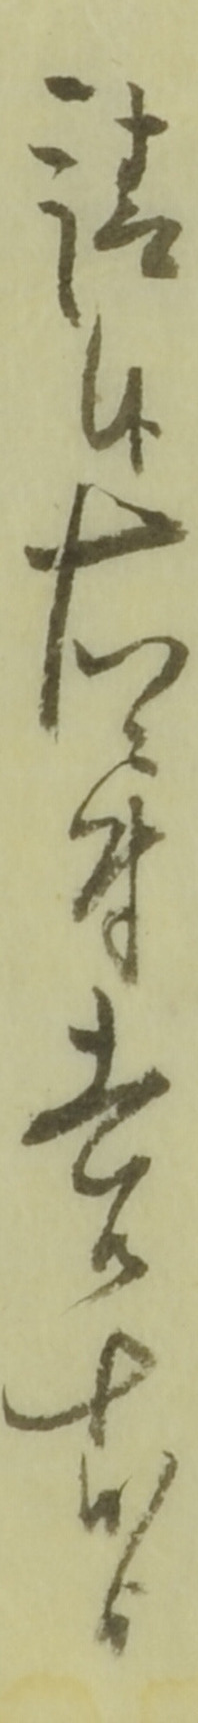請候右ニ付去ル十日ゟ
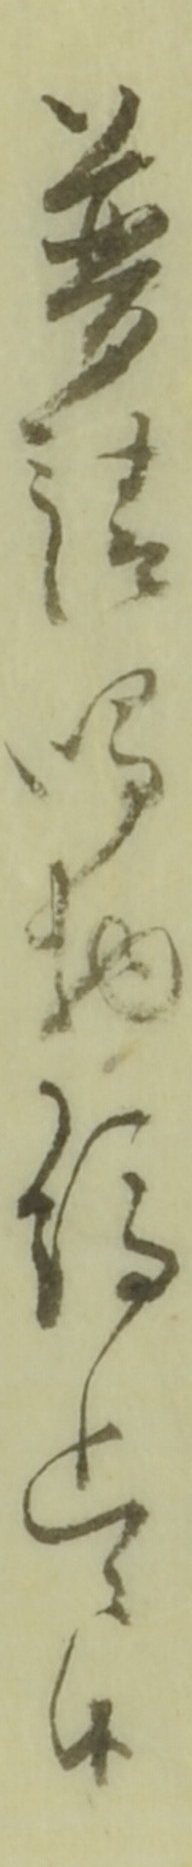普請鳴物停止ニ候
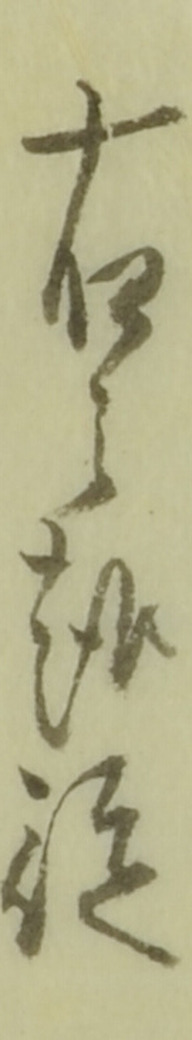右之趣従
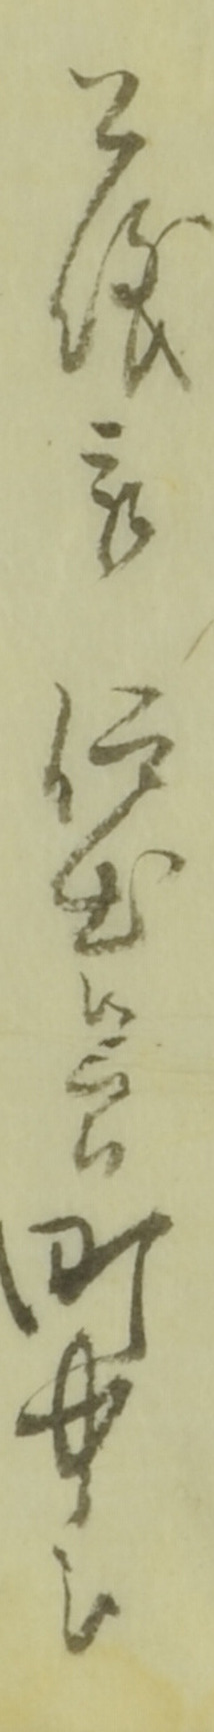公儀被仰出候間町中被
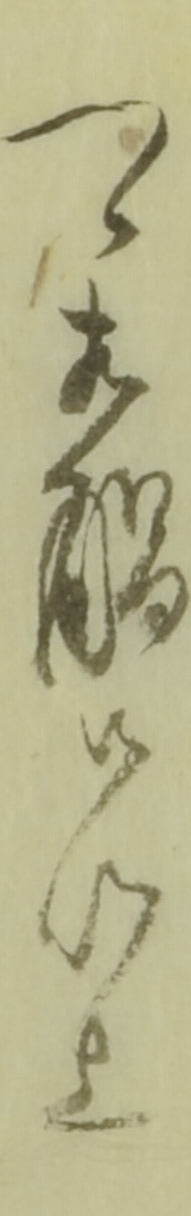可相触候以上
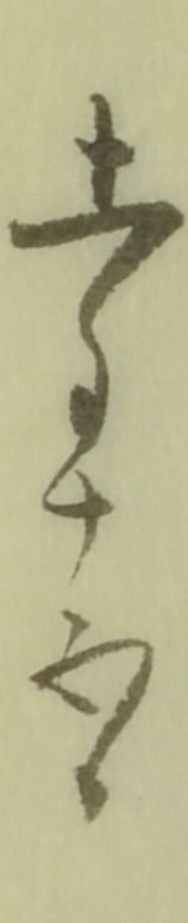十一月十五日

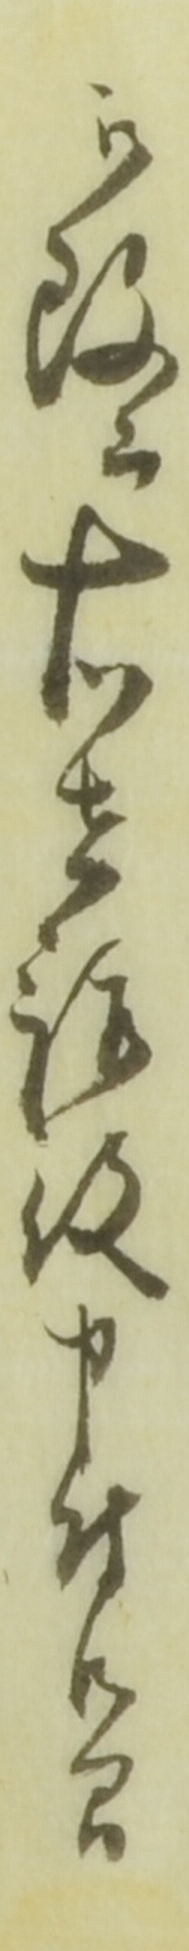被改而右世話役申付候間
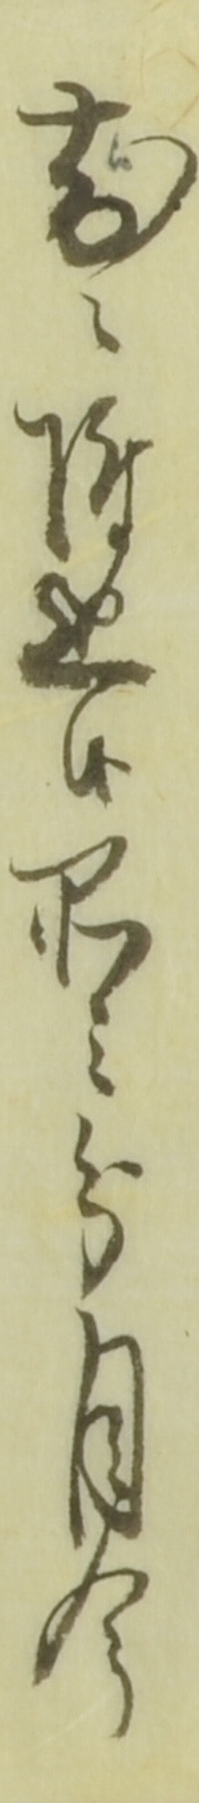前々附込候品之分自今
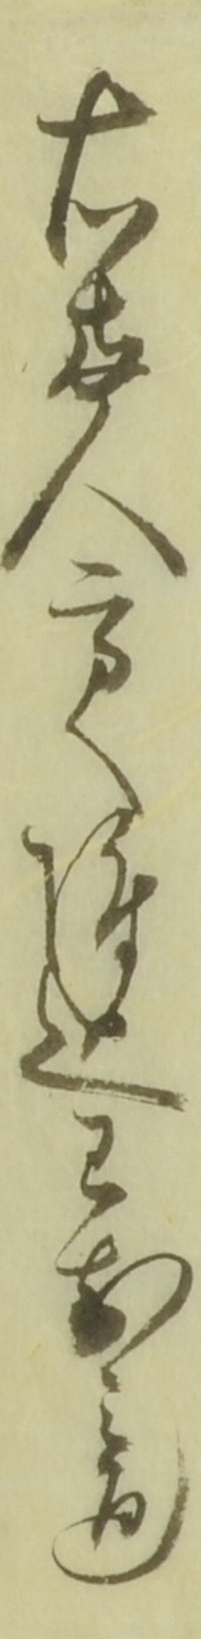右両人方ヘ附込已前之通
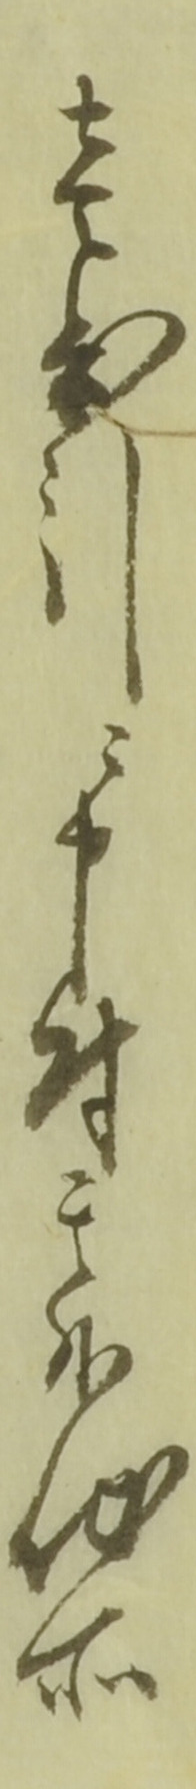壱分引ニ申付其外他所
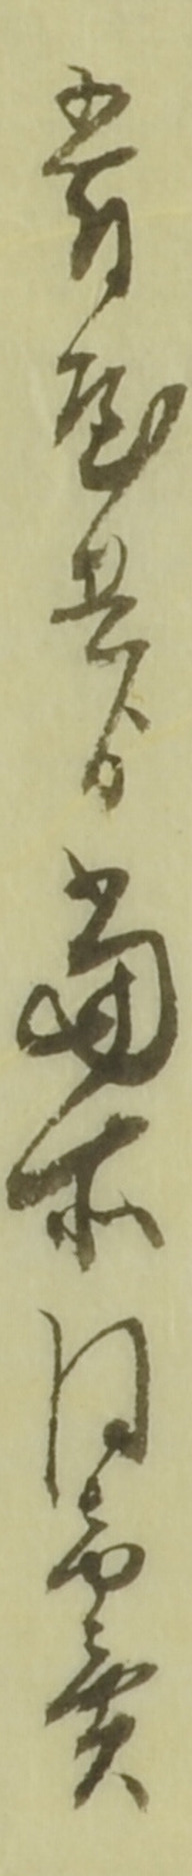肴屋共ゟ当所同商売
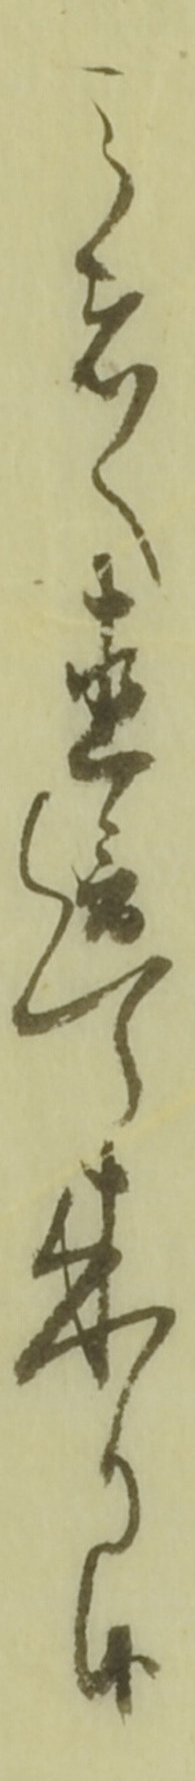之者へ直迄ら来り候
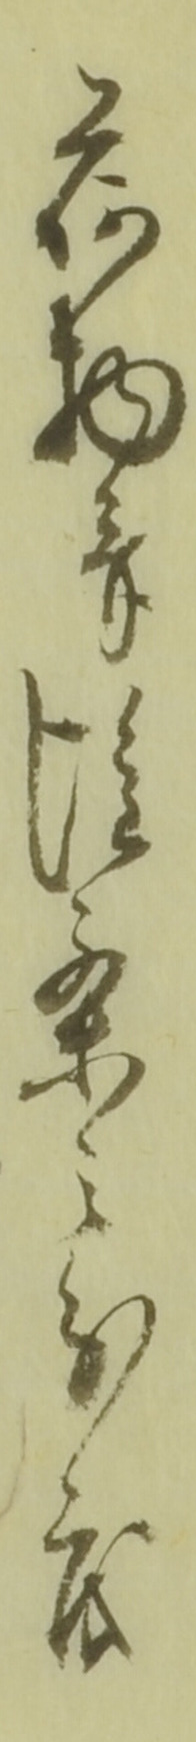荷物并塩茶之分茂
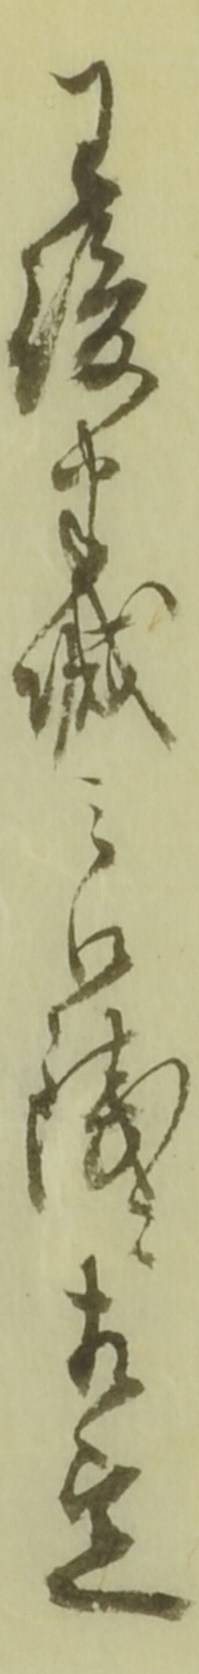已後半減之口銭ニ相定
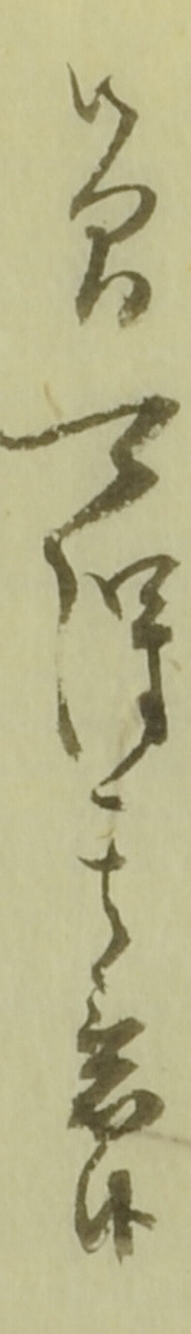候間可得其意候
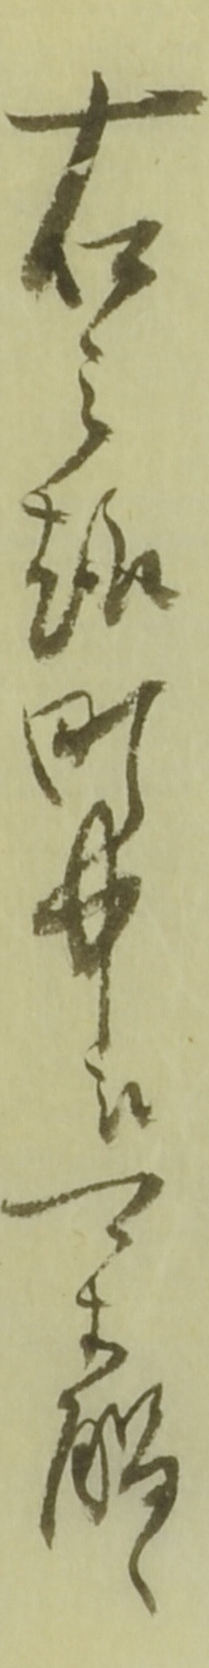右之趣町中江可相触候
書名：御触書御書附控
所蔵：伊那市立高遠町図書館・合同会社AMANE
